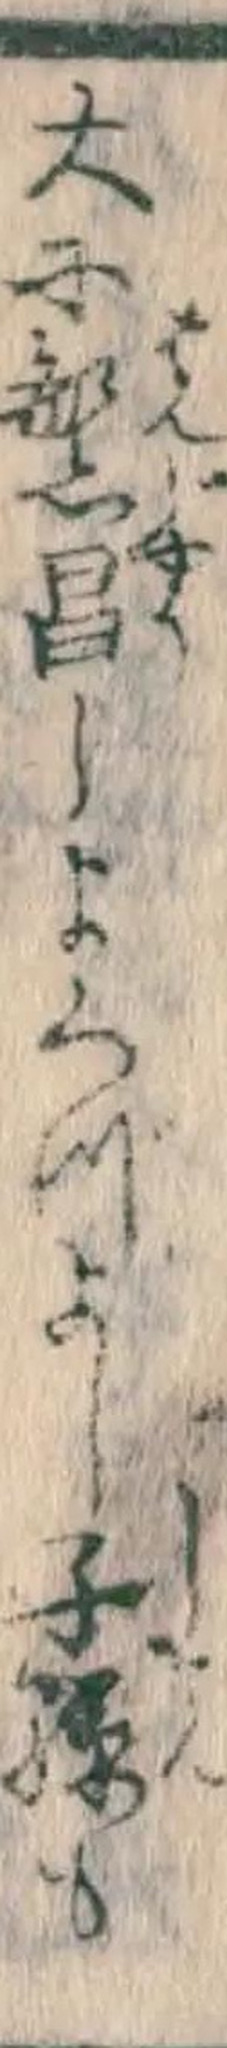大に繁昌しよろづよし子孫も
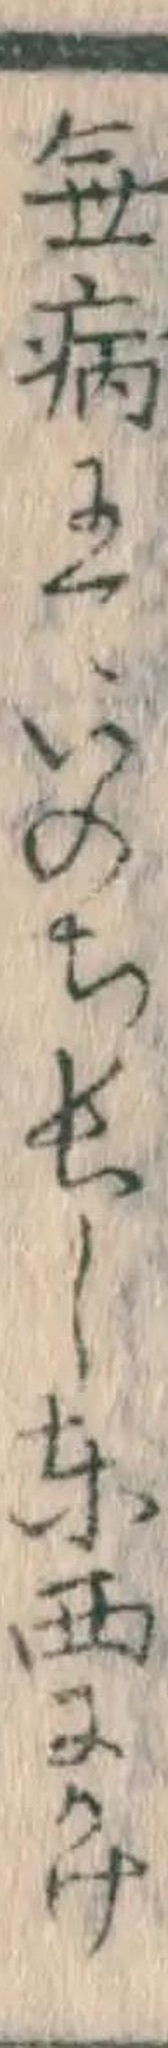無病にていのち長し東西にかけ
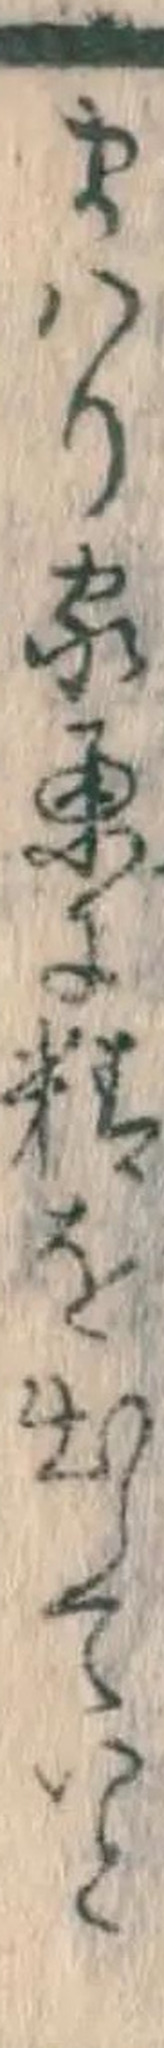まはり家業に精を出していと
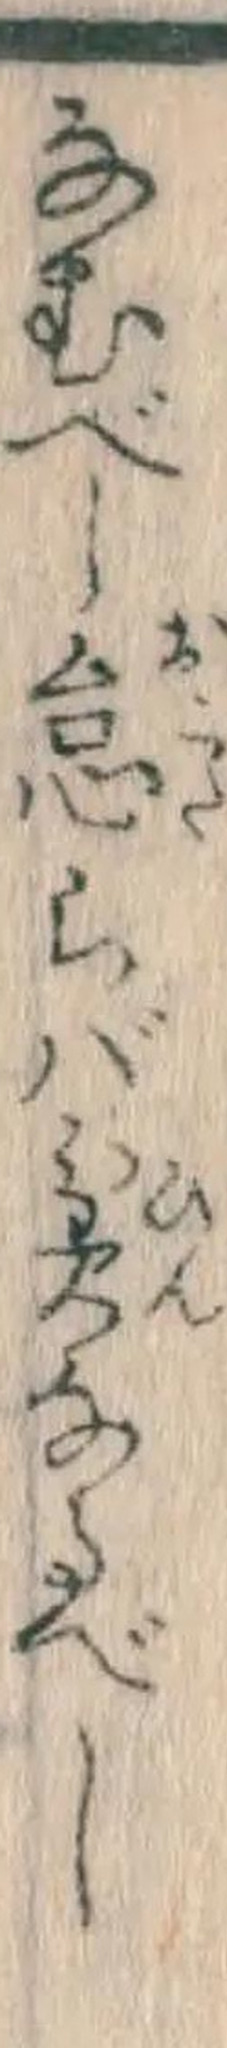なむべし怠らば貧なるべし
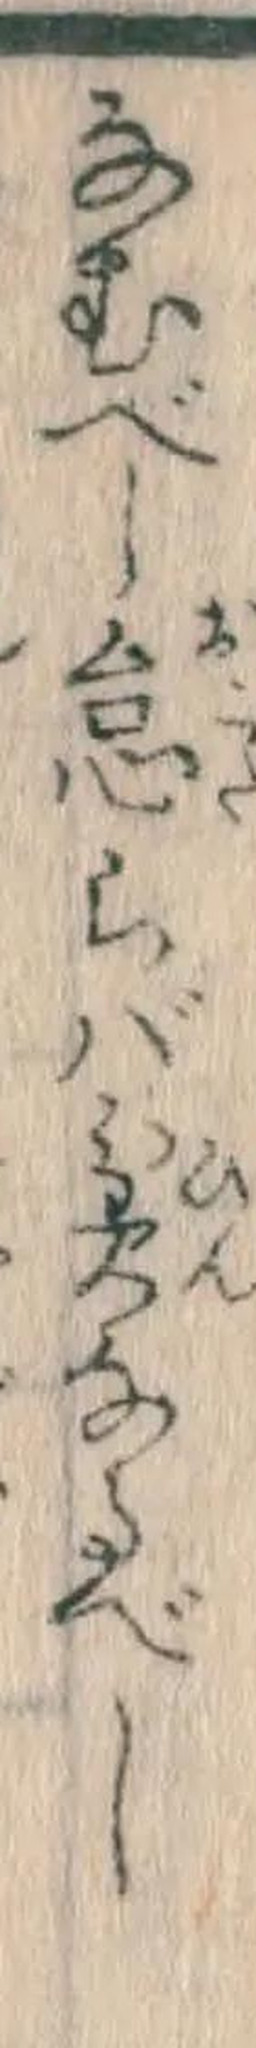なむべし怠らば貧なるべし
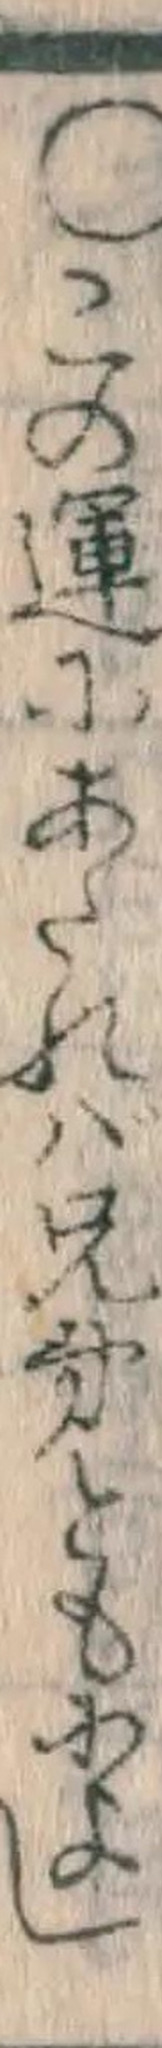○この運にあたれば兄弟ともによし
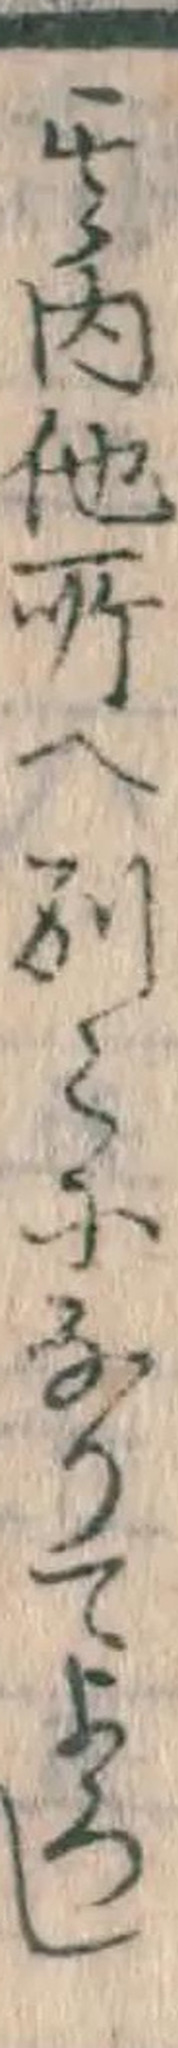其内他所へ別々になりてよろし
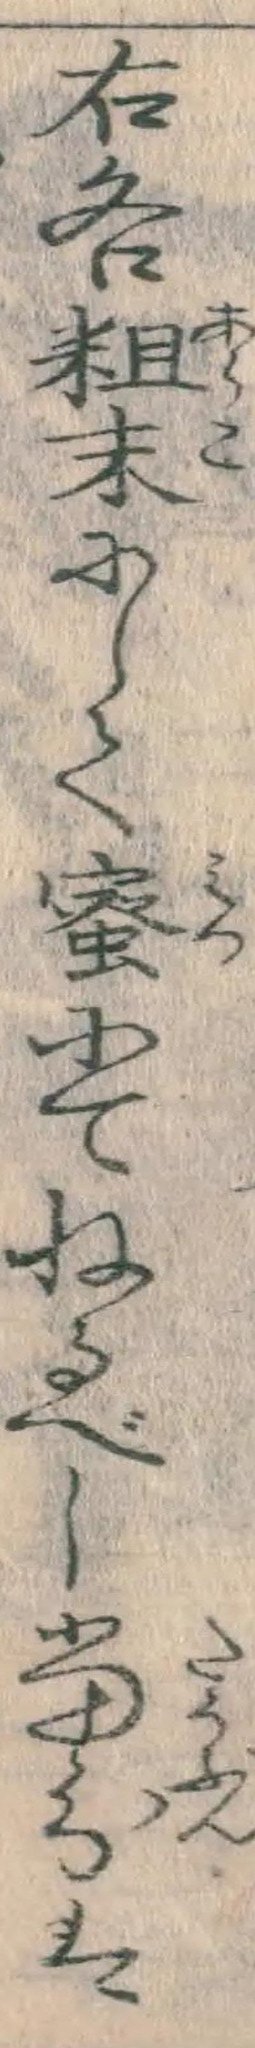右各粗末にして蜜にてねるべし当分は
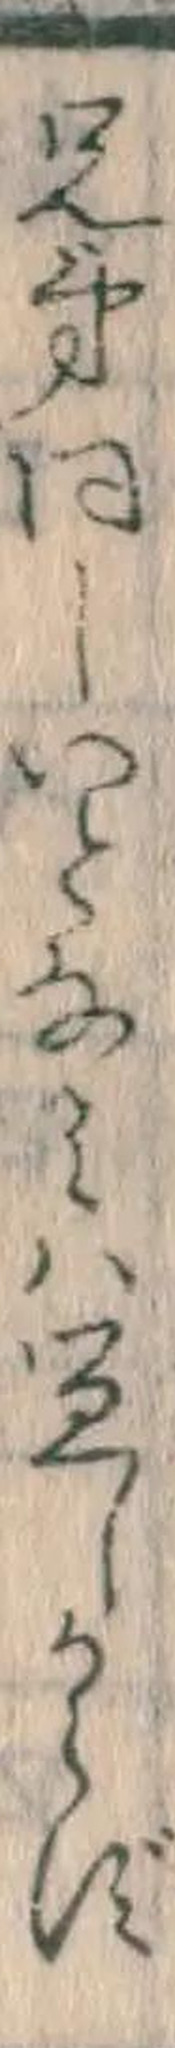兄弟同しいとなみは宜しからず
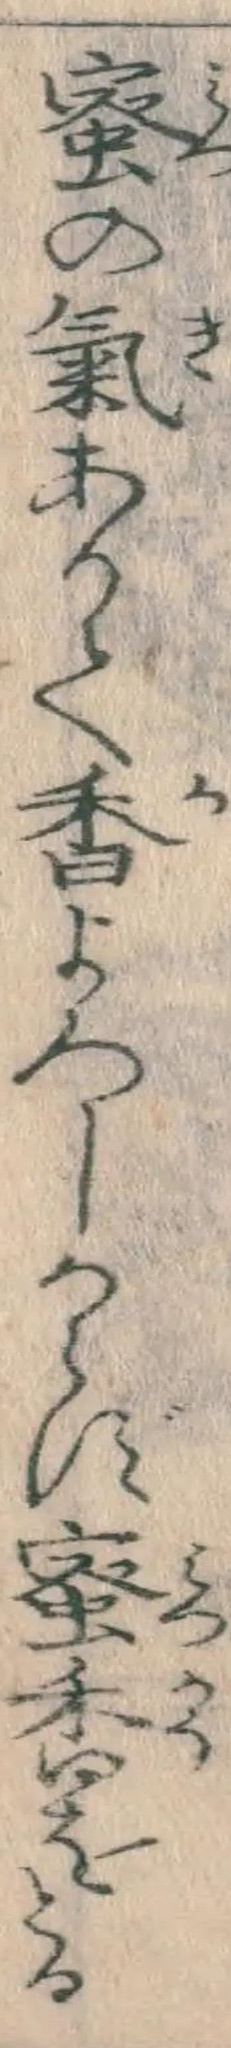蜜の気ありて香よろしからず蜜香をとる
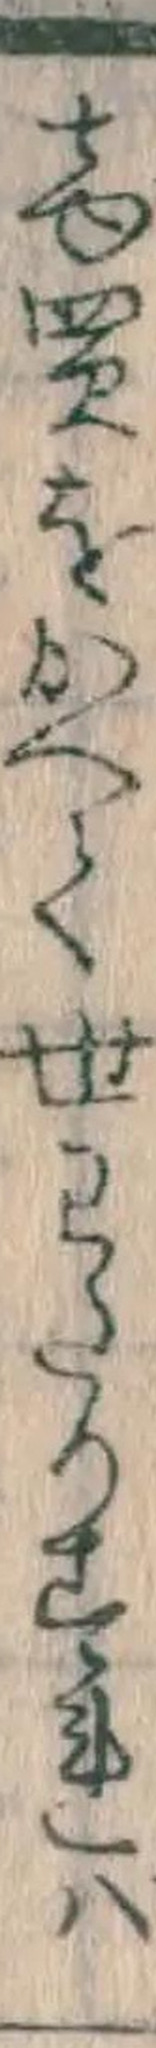商買をかへて世わたりすれば
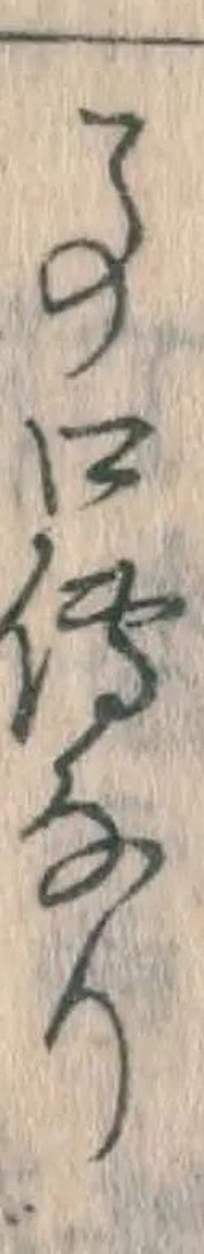事口伝なり
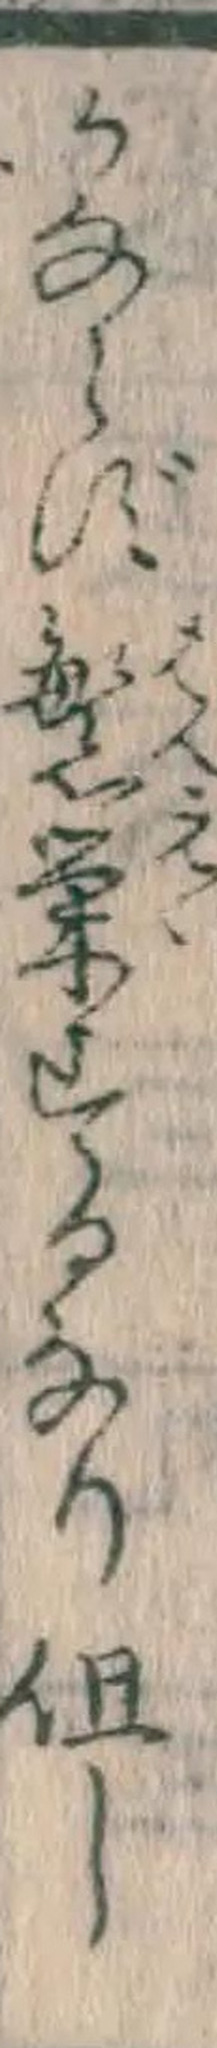かならず繁栄するなり但し
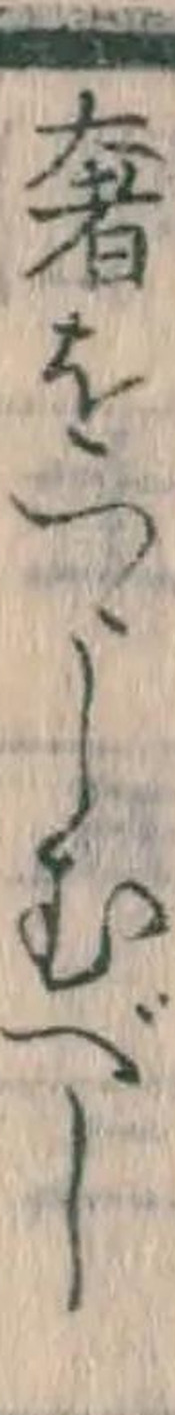奢をつゝしむべし
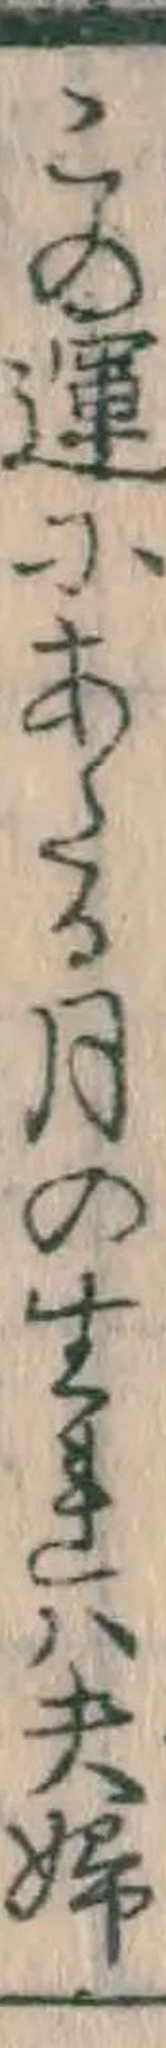この運にあたる月の生れは夫婦
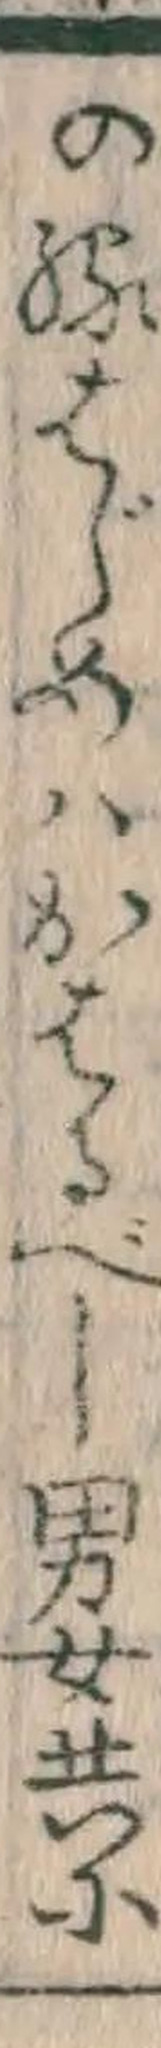の縁はじめはかはるべし男女共に
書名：広益秘事大全 3巻. [2]
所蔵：国立国会図書館 National Diet Library, JAPAN
